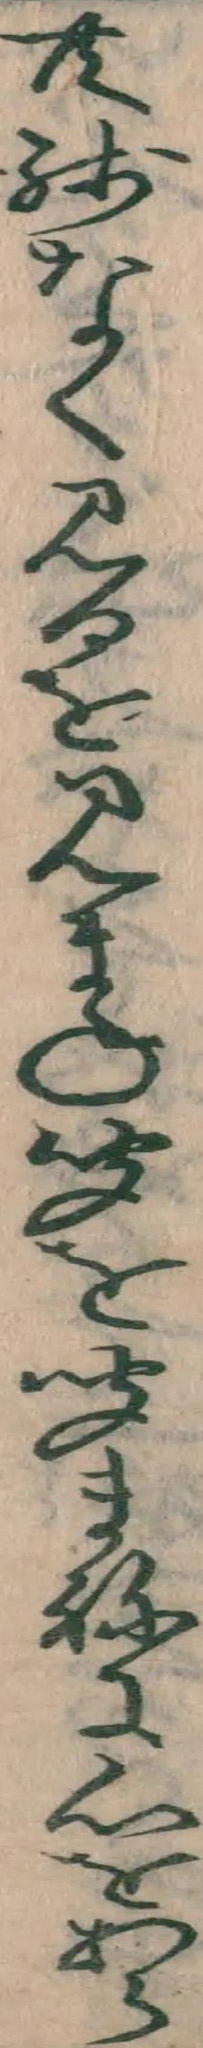共残なく見るを見まね聞を聞まねに心をあら
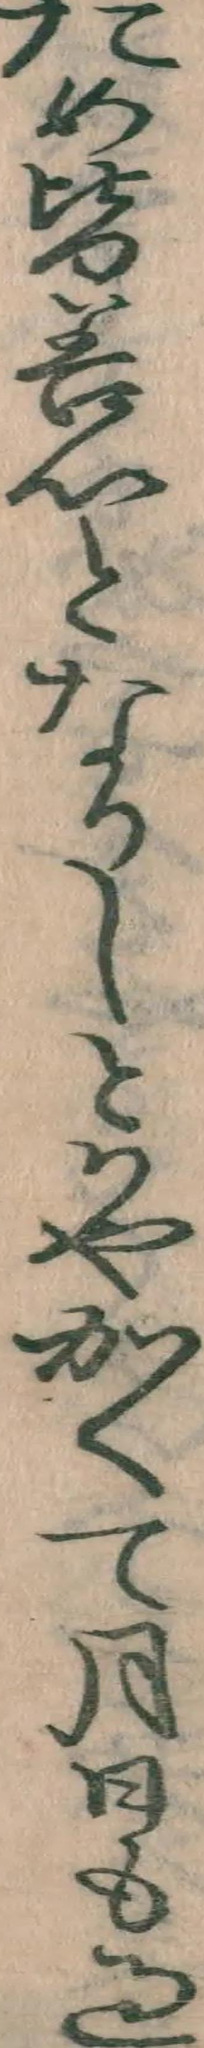ため皆善心となりしとかやかくて月日も過
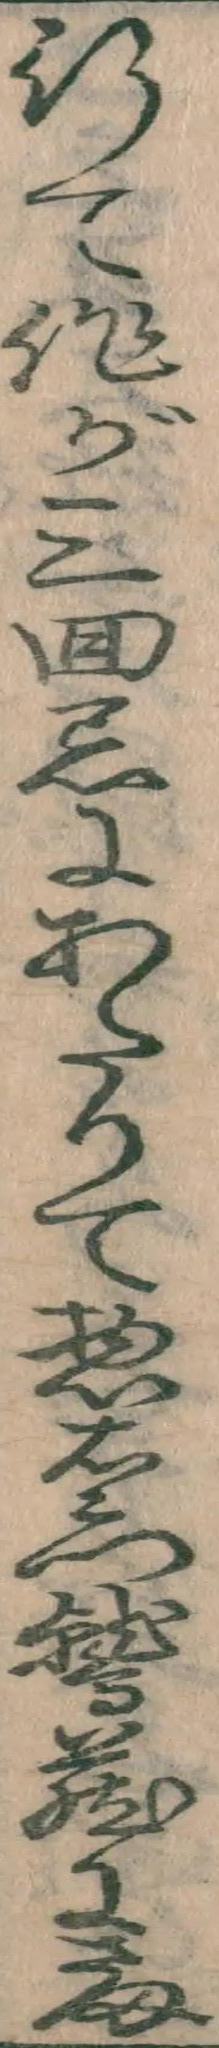行て作が三回忌にあたりて惣右衛門鷲蔵にさま
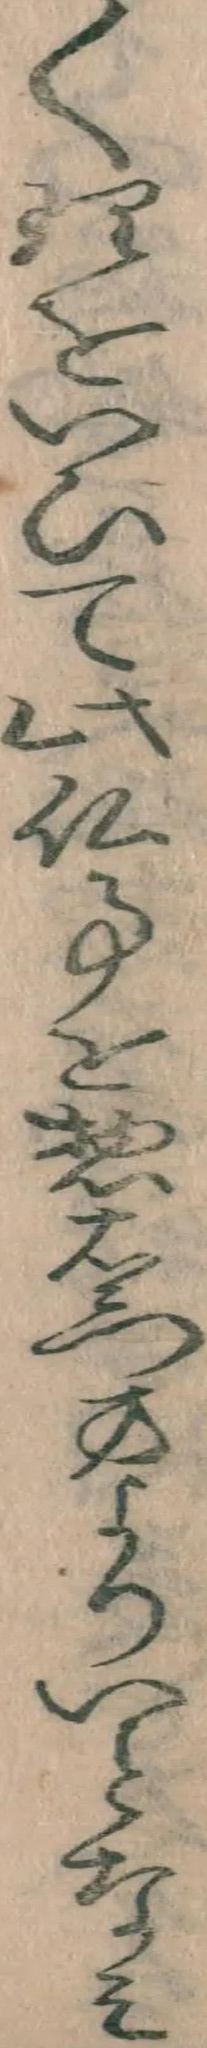〳〵理をいひて此仏事を惣右衛門方よりいとなみ
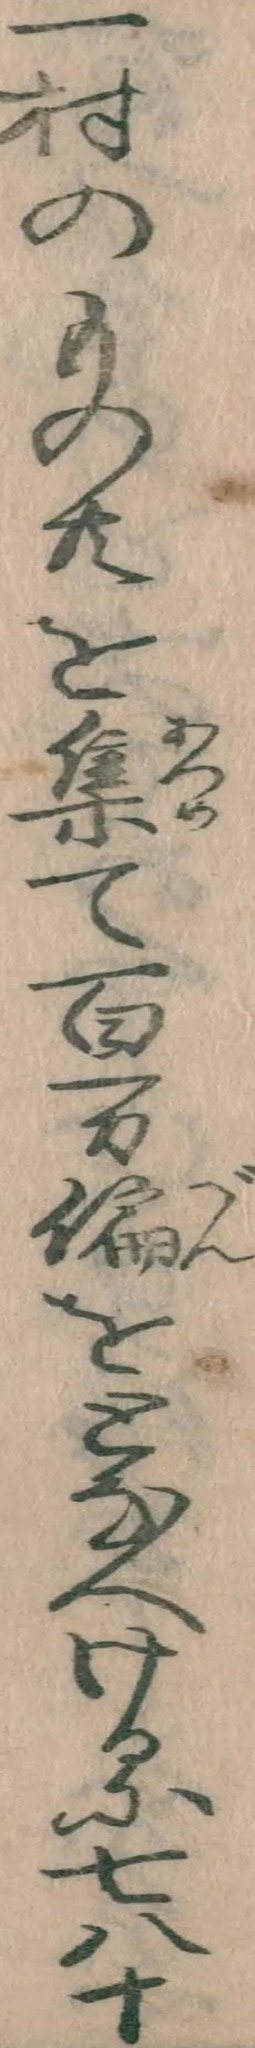一村のもの共を集て百万偏をとなへけるに七八十
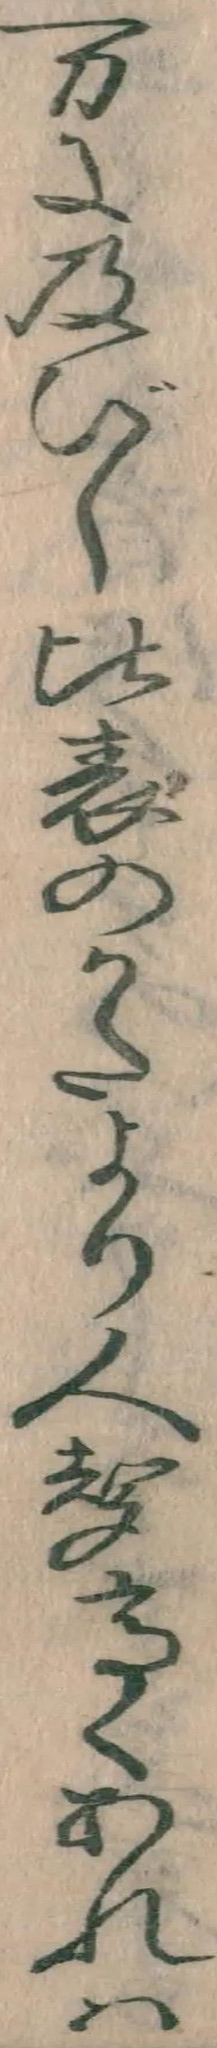万に及びし頃表のかたより人声高くあれは
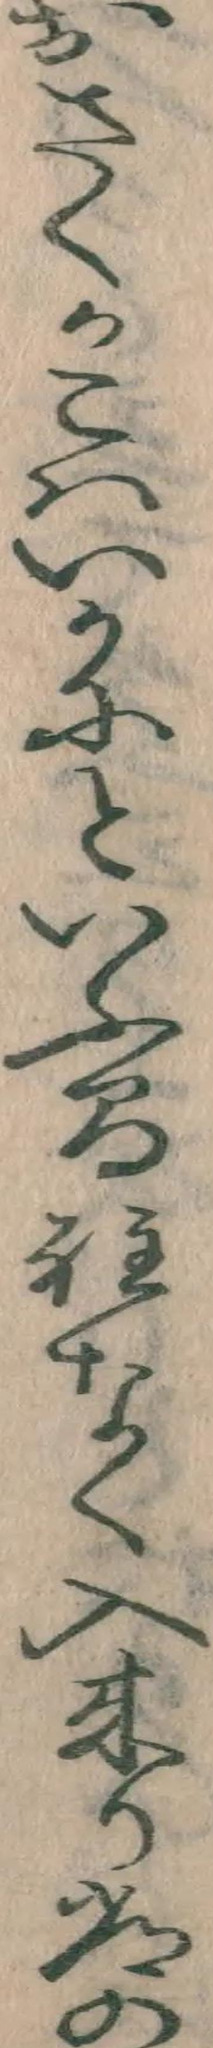おさくかこはいかにといふ間程なく入来り常の
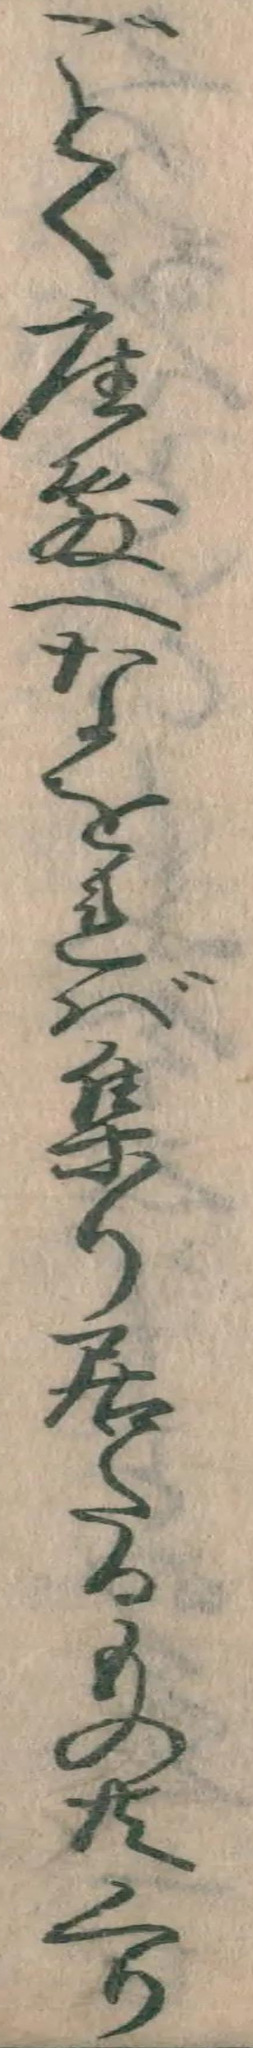ごとく座敷へなをれば集り居たるもの共くり
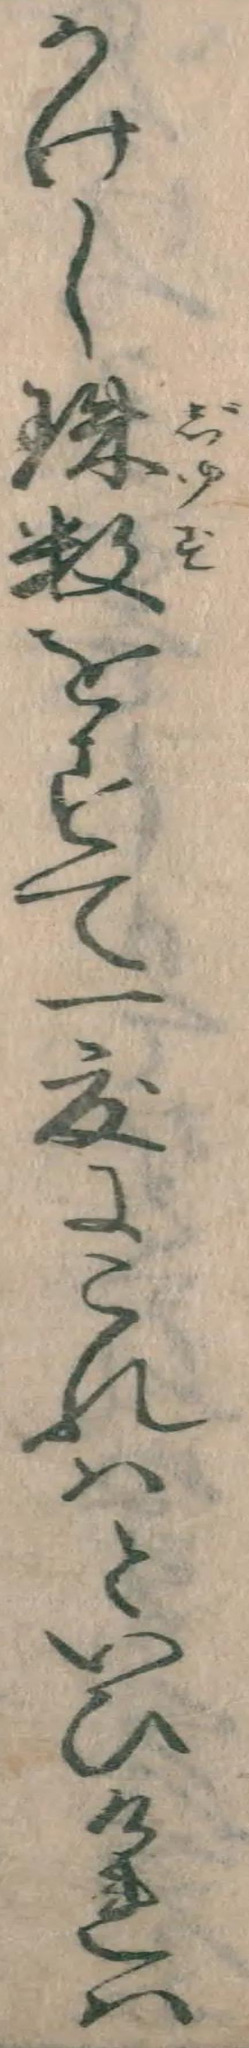かけし珠数をすて一度にこれおはといひけれは
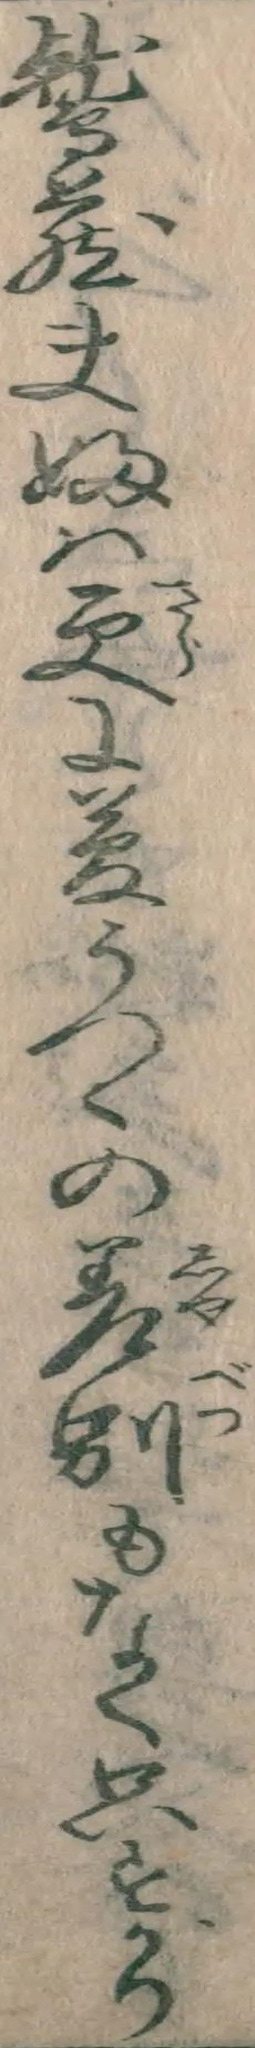鷲蔵夫婦は更に夢うつゝの差別もなく只すがり
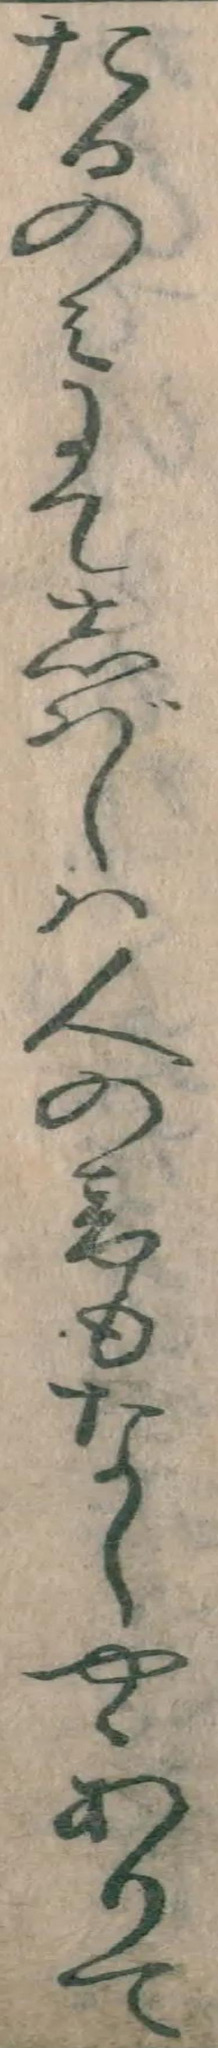たるのみにてしばしは人の音もなしやゝありて
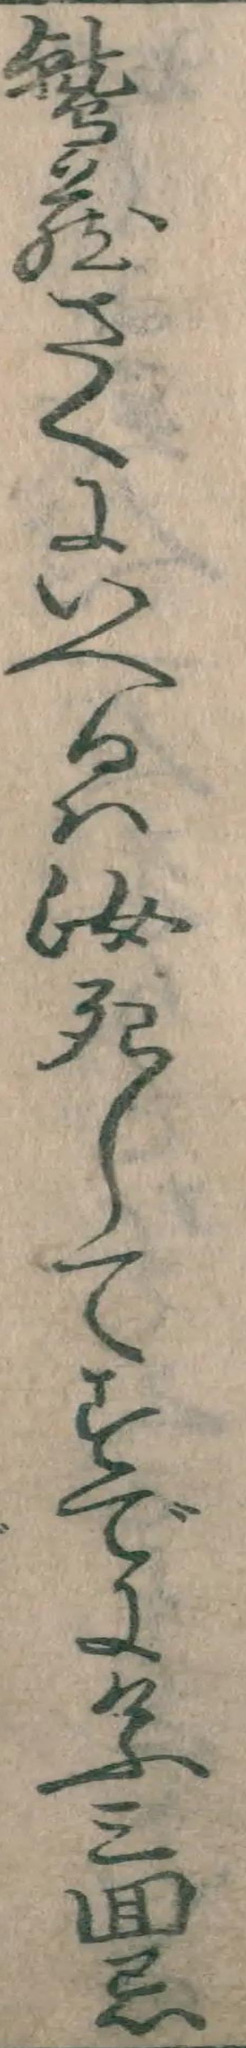鷲蔵さくにいへるは汝死してすでにけふ三回忌
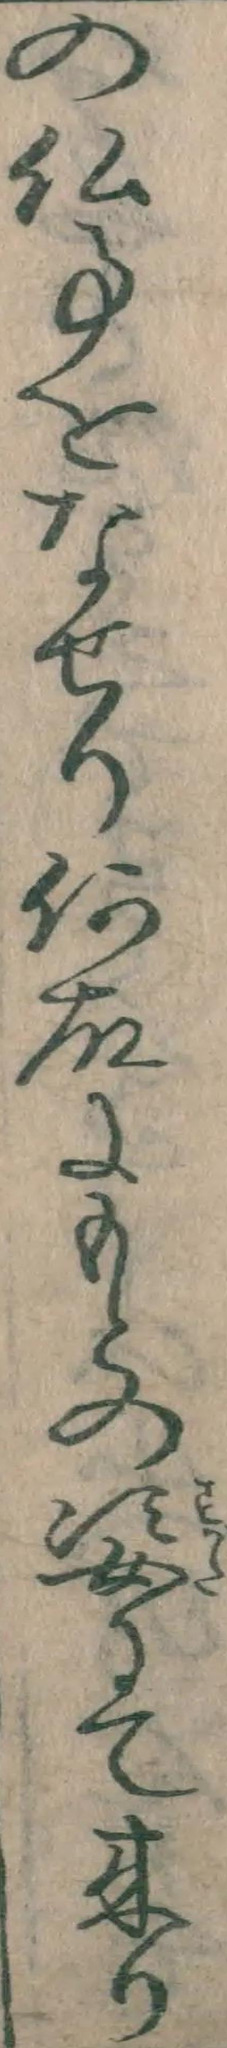の仏事をなせり何故にもとの姿にて来り

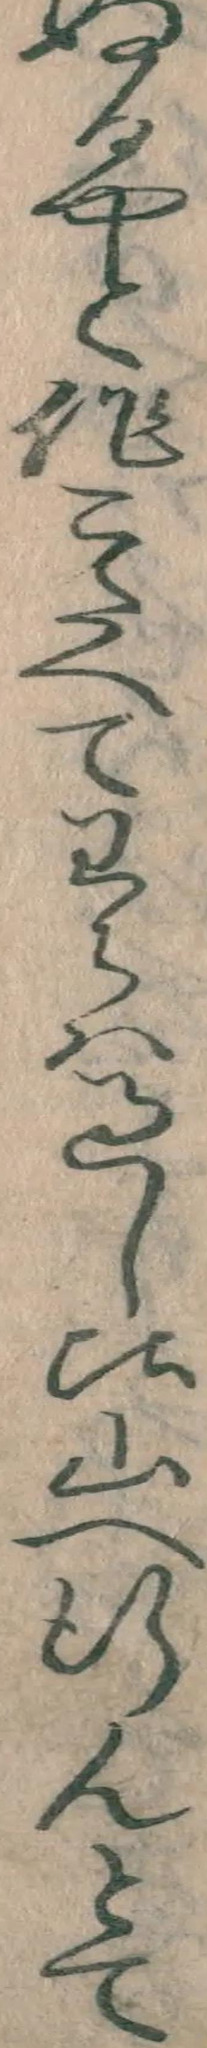ぬるやと作こたへてわらは過し頃山へ行んとて
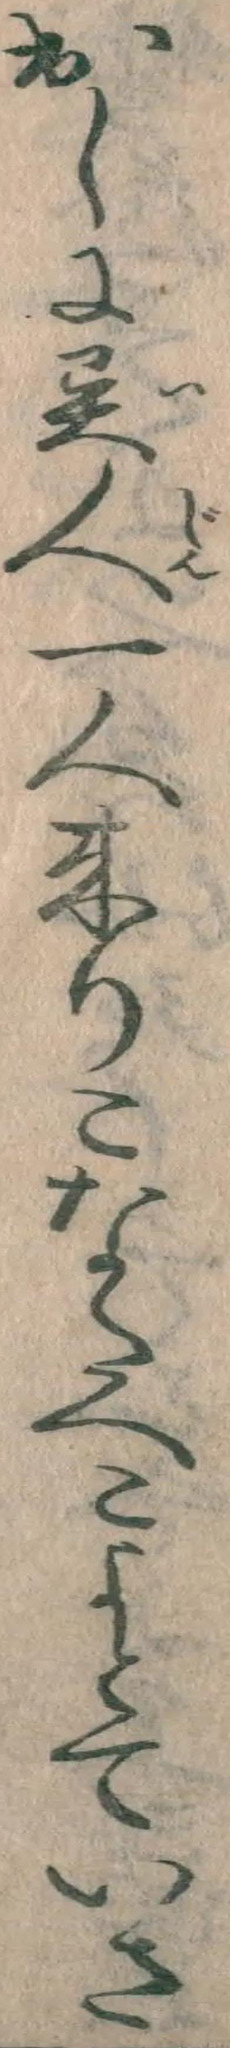出しに異人一人来りこなたへこよとていさ
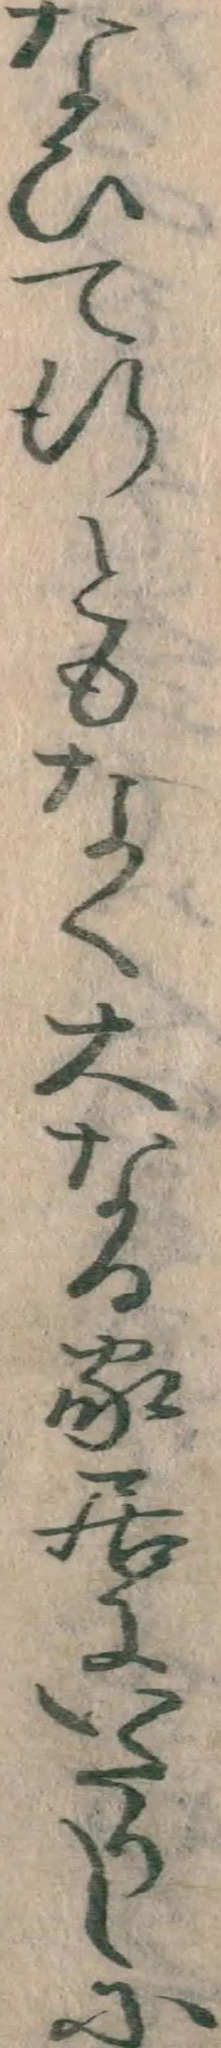なひて行ともなく大なる家居にいたりしに
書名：怪談御伽童 5巻. [1]
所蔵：国立国会図書館 National Diet Library, JAPAN
